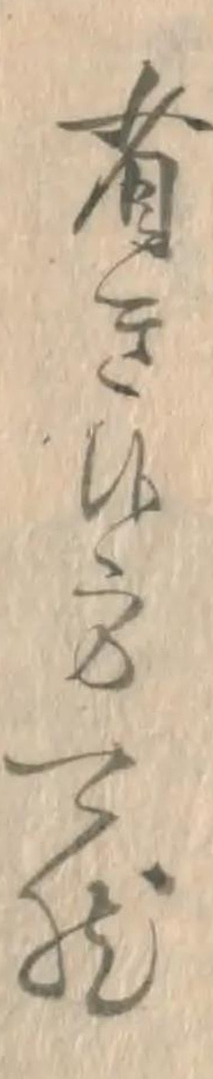省き候方可然

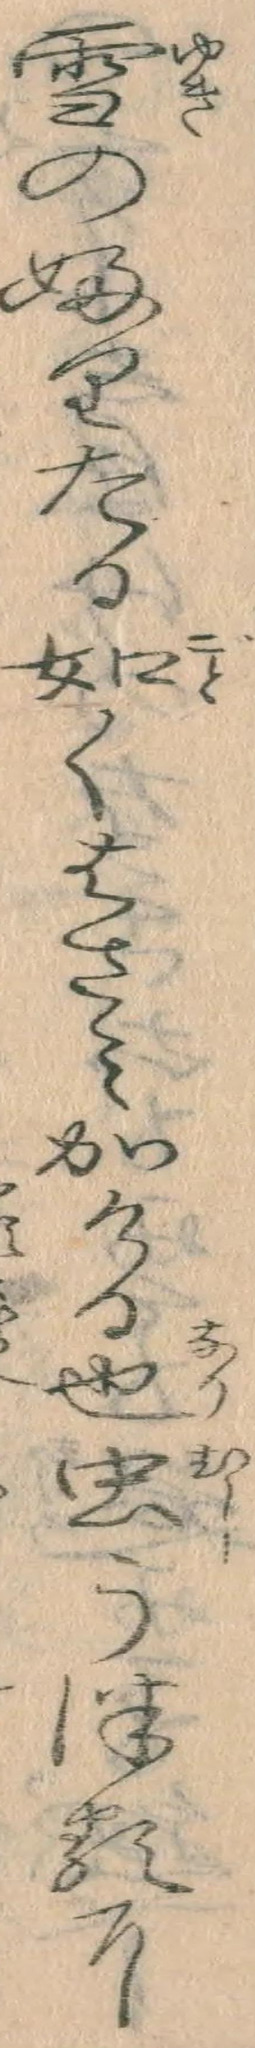雪のふりたる如くはさみかける也虫うつるに
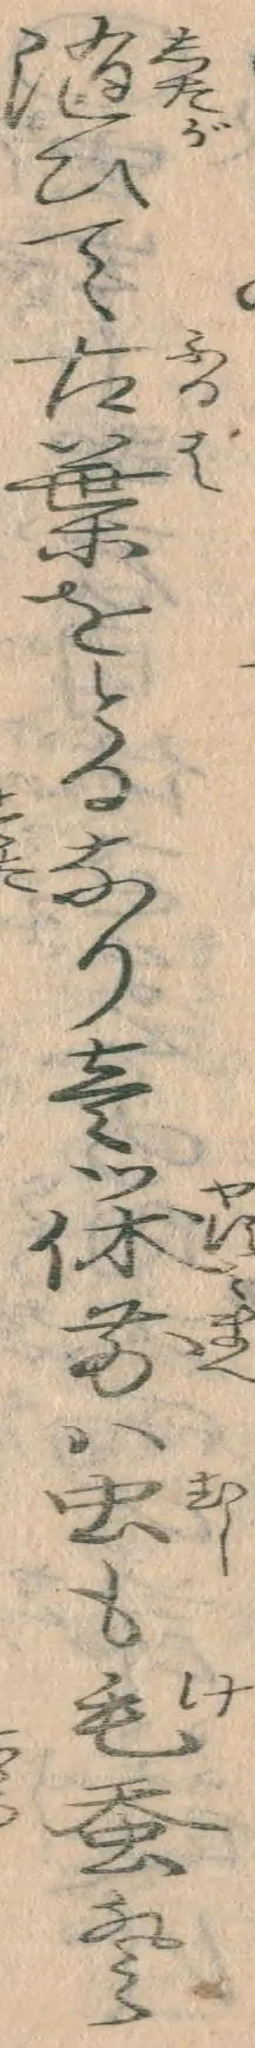随ひて古葉をとるなり壱ツ休前は虫も毛蚕と
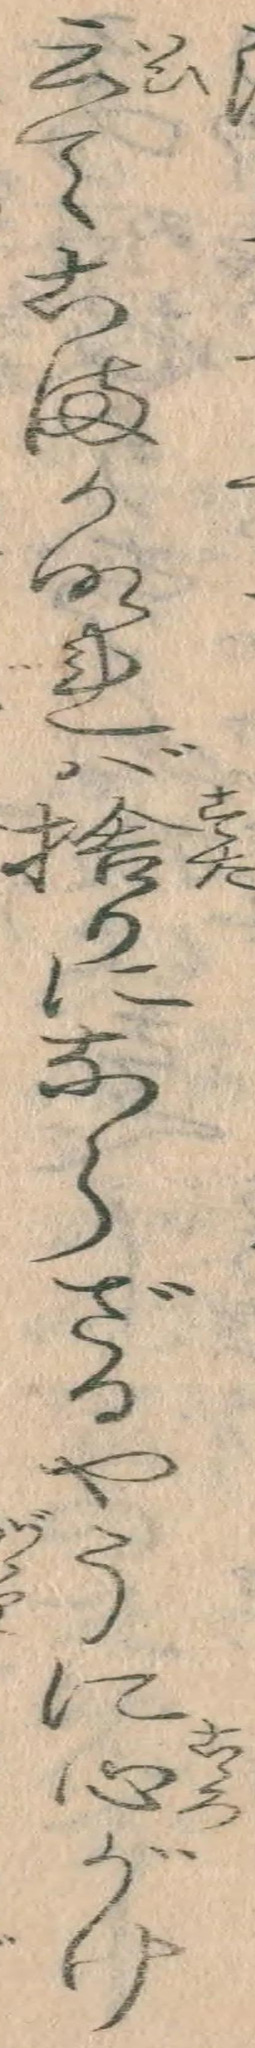云てこまかなれば捨りにならざるやうに心がけ
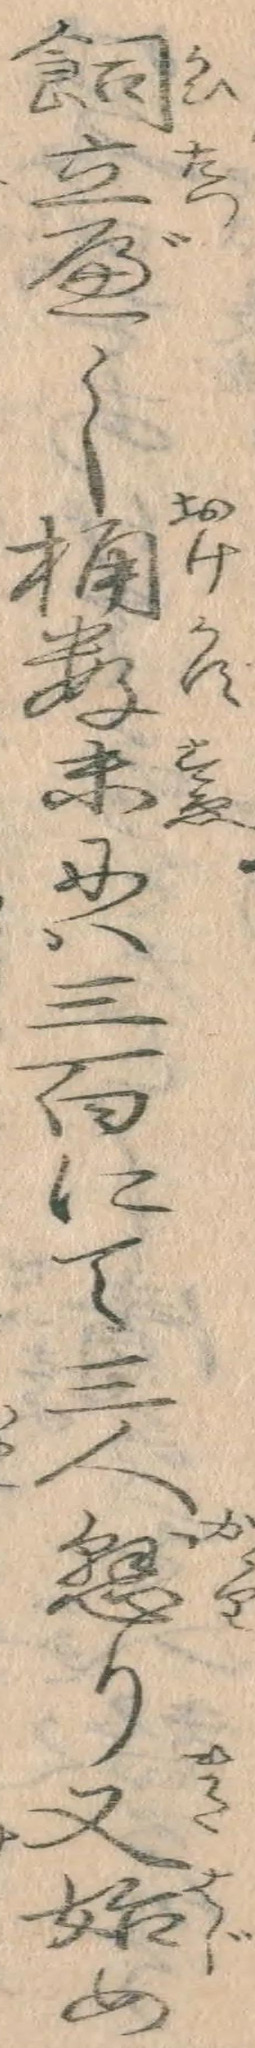飼立べし桶数末には三百にて三人懸り又始め
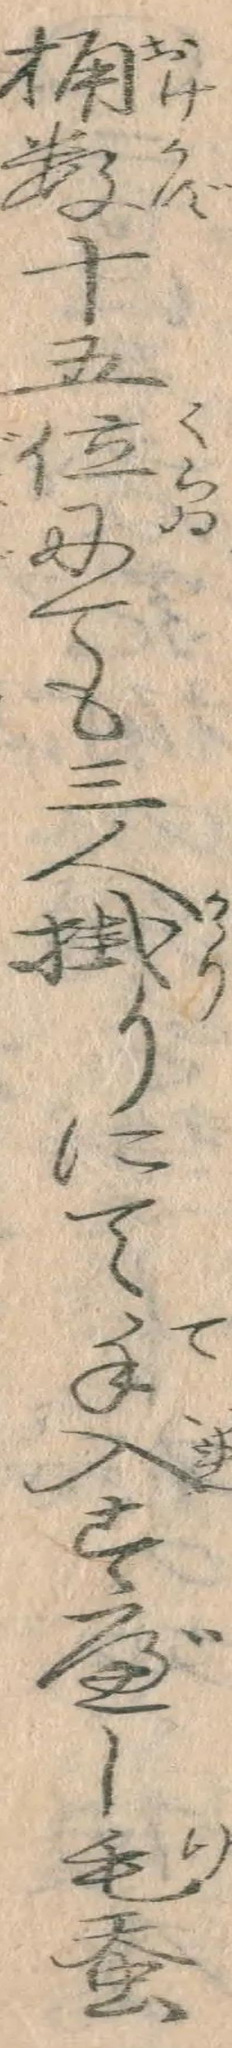桶数十五位にても三人掛りにて手入すべし毛蚕
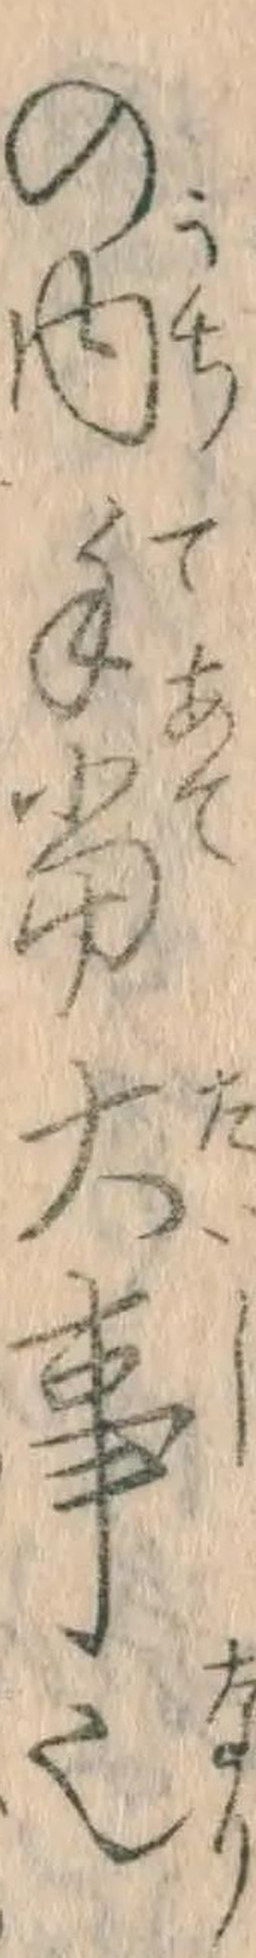の内手当大事也
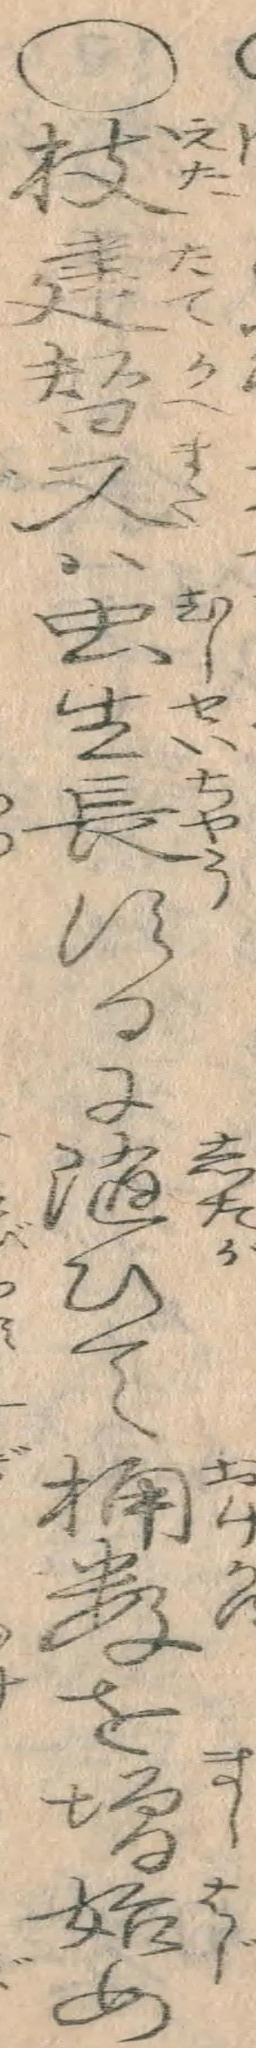○枝建替又は虫生長するに随ひて桶数を増始め
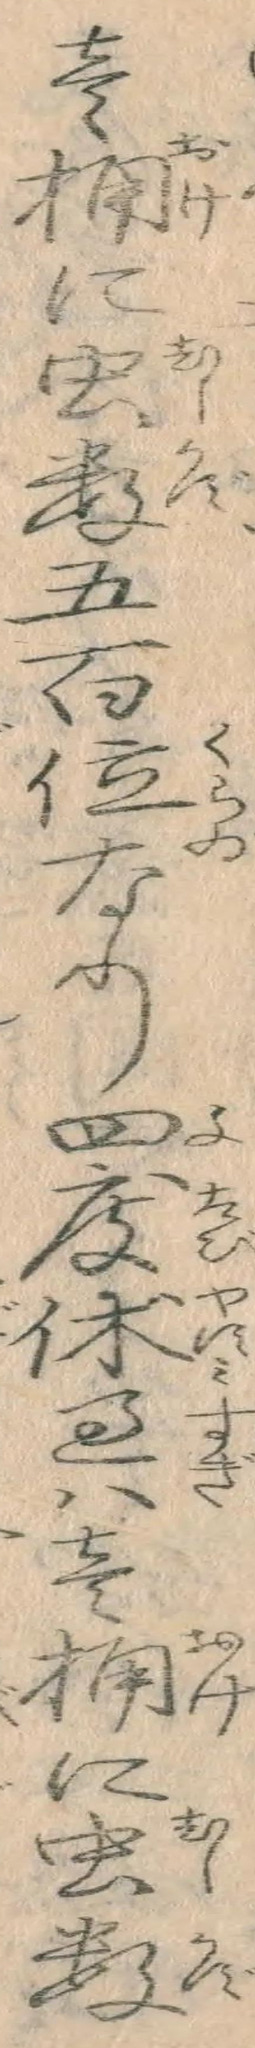壱桶に虫数五百位なり四度休過は壱桶に虫数
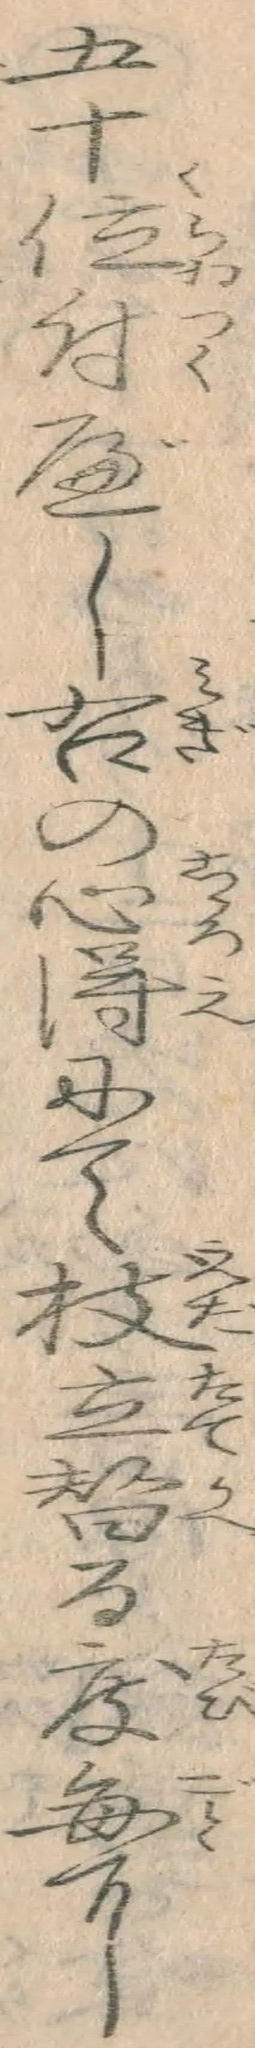五十位付べし右の心得にて枝立替る度毎耳
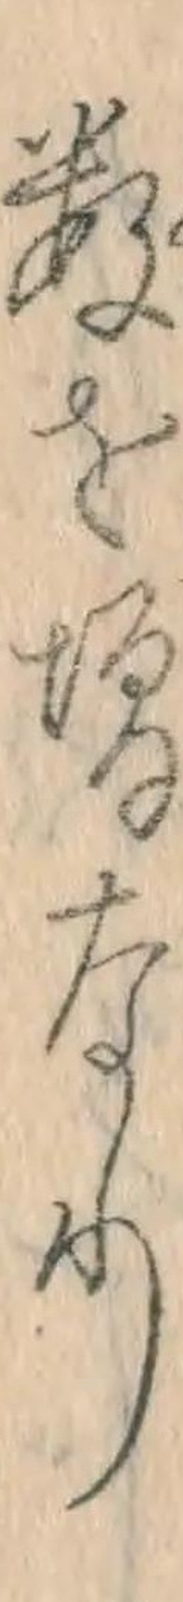数を増なり
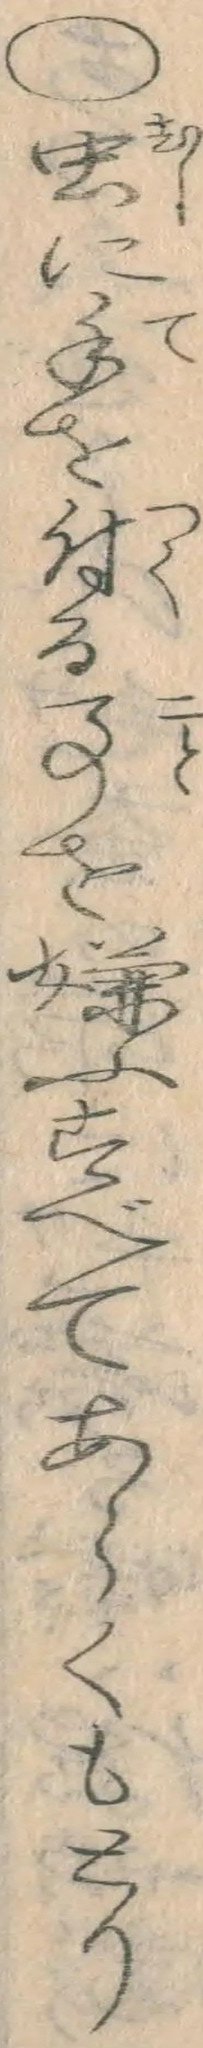○虫に手を付る事を嫌ふすべてあらくもとり

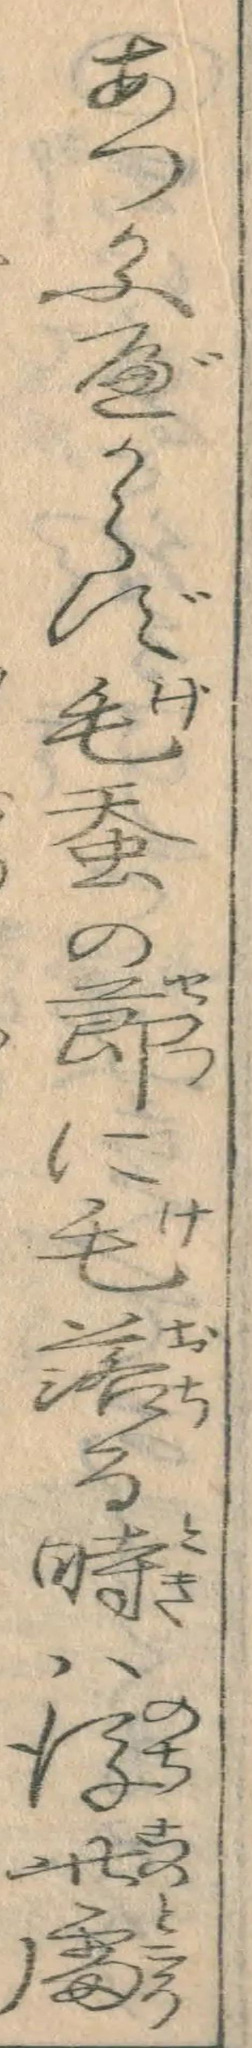あつかふべからず毛蚕の節に毛落る時は後此處
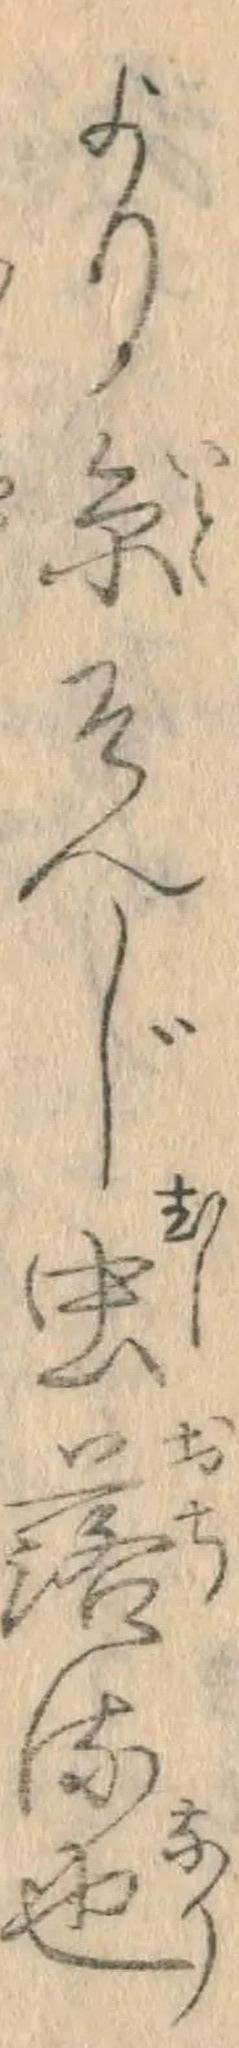より糸そんじ虫落る也
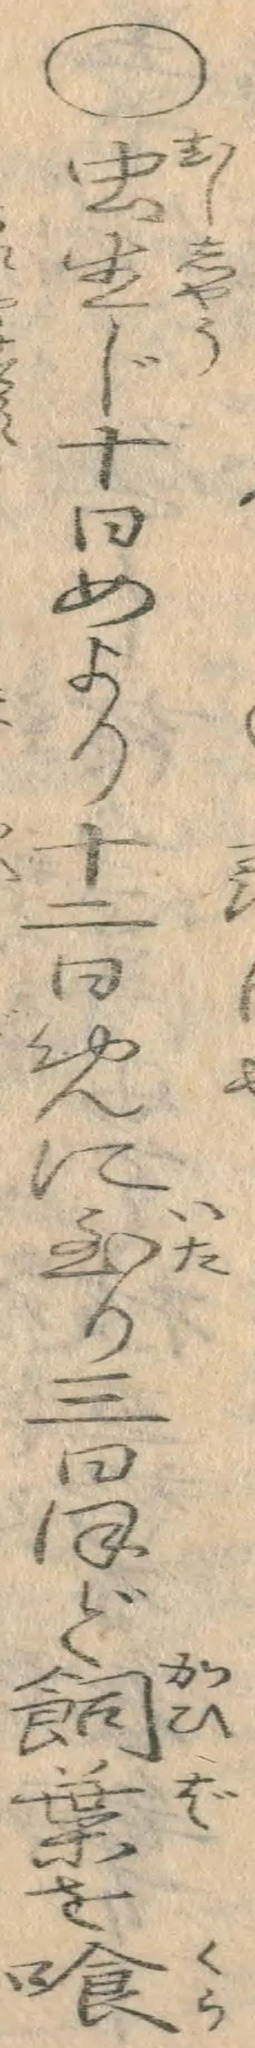○虫生じ十日めより十二日めに至り三日ほど飼葉を喰
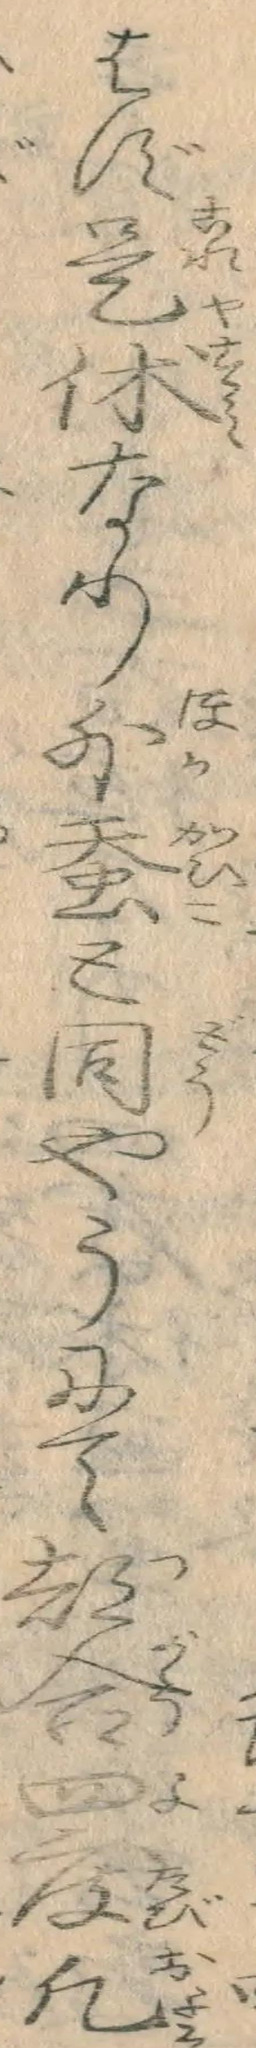はず是休なり外蚕と同やうにて都合四度凡
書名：山繭養法秘傳抄
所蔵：国立国会図書館 National Diet Library, JAPAN
